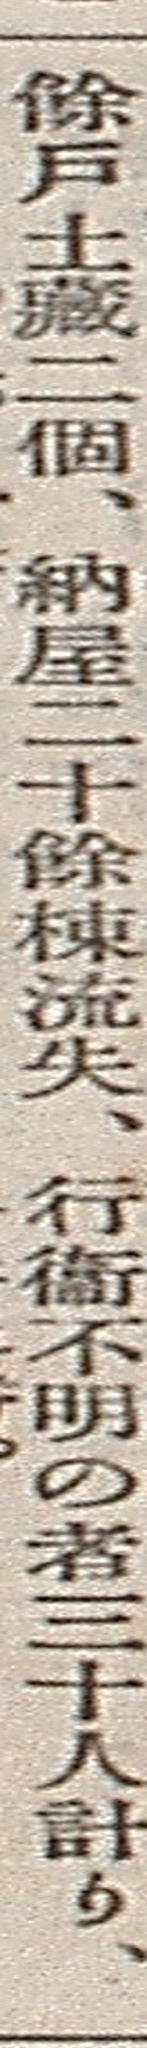餘戸土蔵二個、納屋二十餘棟流失、行衛不明の者三十人計り、
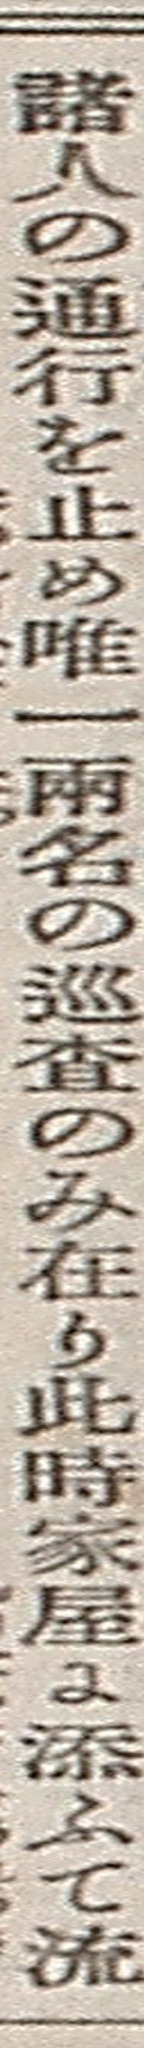諸人の通行を止め唯一兩名の巡査のみ在り此時家屋に添ふて流
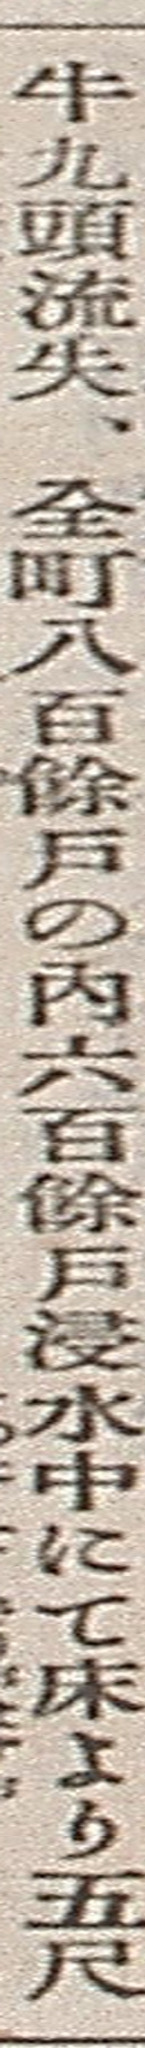牛九頭流失、全町八百餘戸の内六百餘戸浸水中にて床より五尺
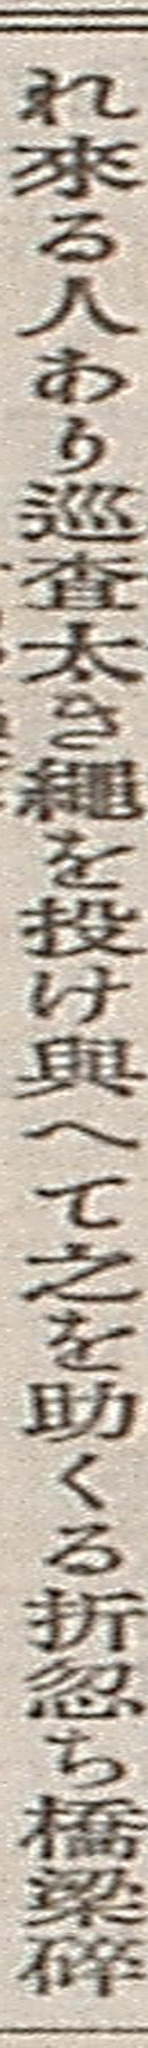れ来る人あり巡査太き縄を投げ与へて之を助くる折忽ち橋梁砕
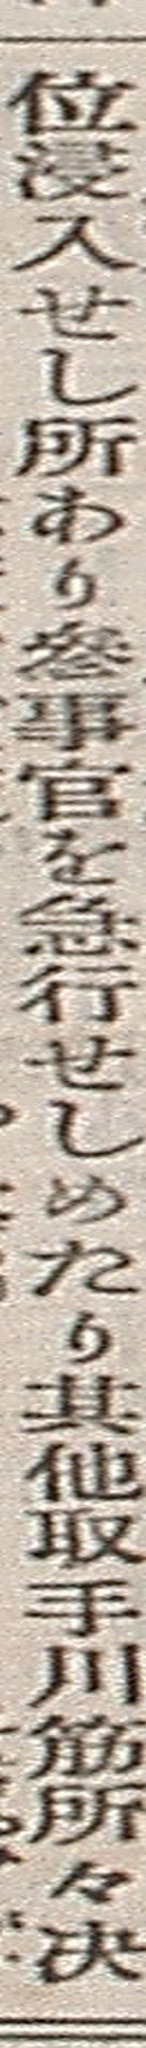位侵入せし所あり参事官を急行せしめたり其他手取川筋所々决
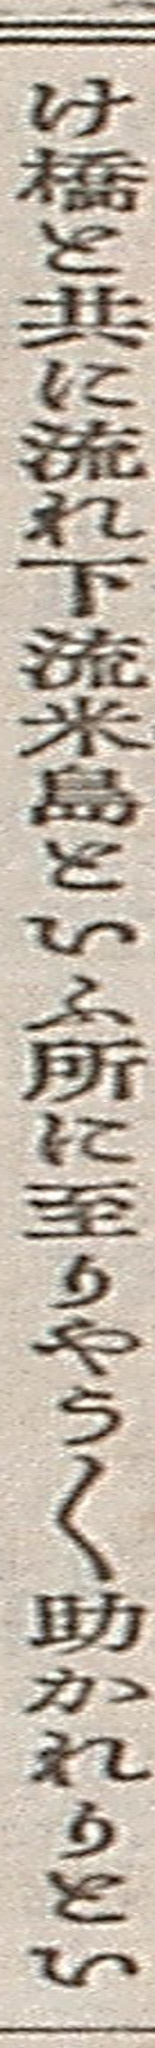け橋と共に流れ下流米島といふ所に至りやう〳〵助かれりとい
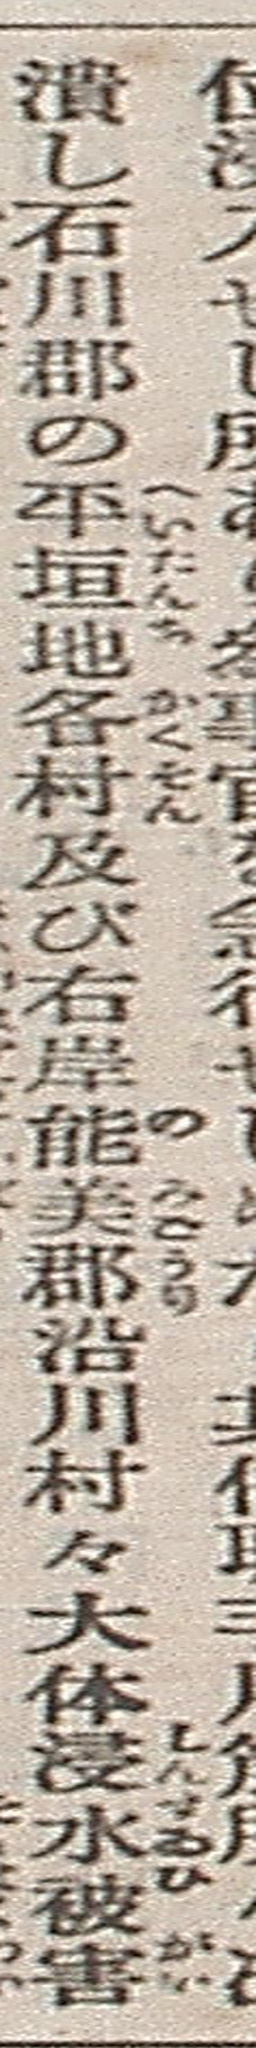潰し石川郡の平坦地各村及び右岸能美郡沿川村々大体浸水被害
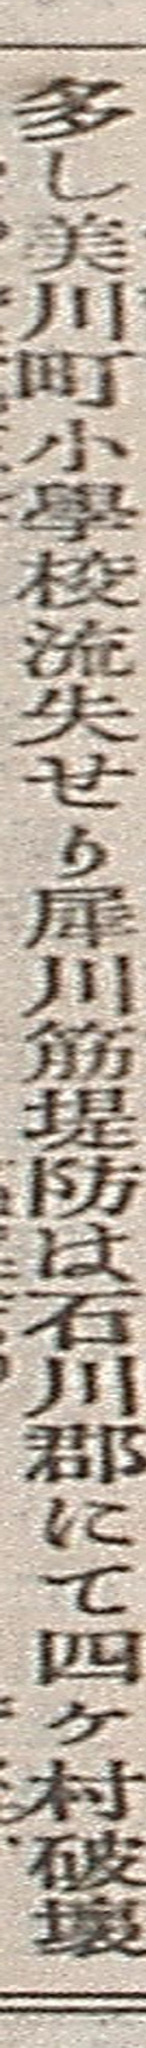多し美川町小学校流失せり犀川筋堤防は石川郡にて四ヶ村破壊
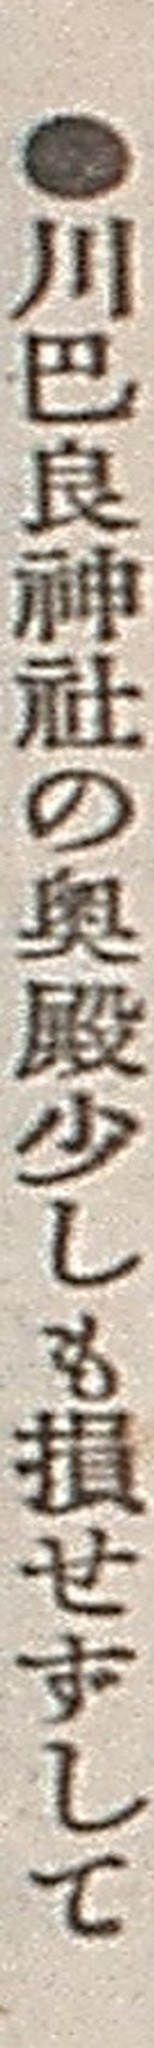●川巴良神社の奥殿少しも損せずして
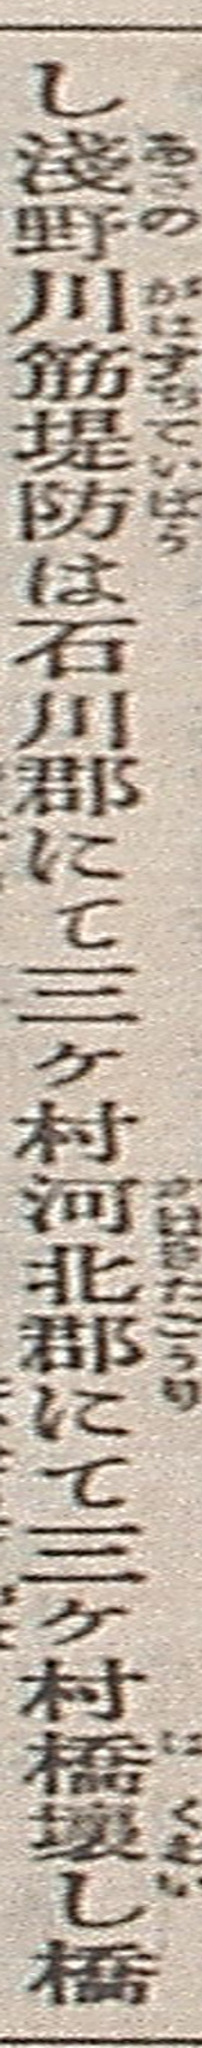し浅野川筋堤防は石川郡にて三ヶ村河北郡にて三ヶ村破壊し橋
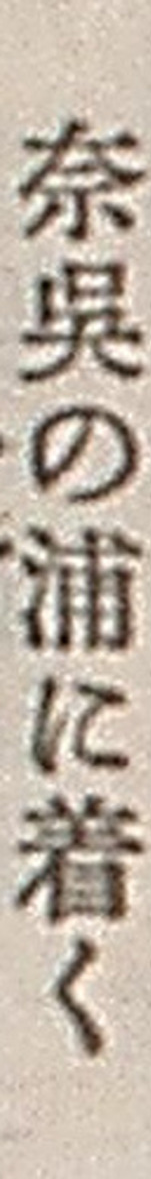奈呉の浦に着く
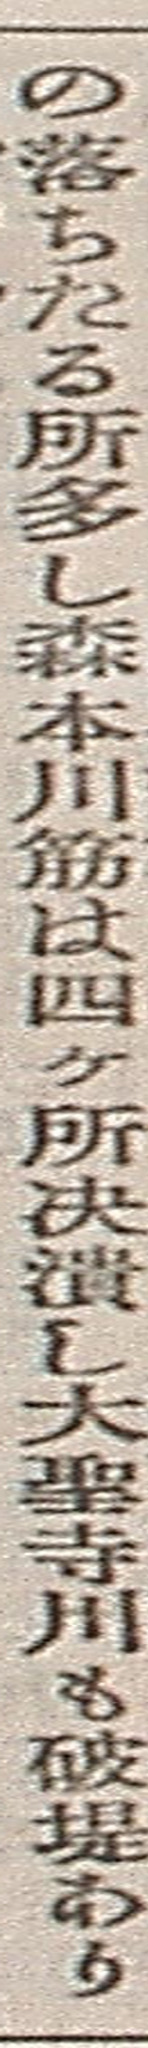の落ちたる所多し森本川筋は四ヶ所决潰し大聖寺川も破堤あり
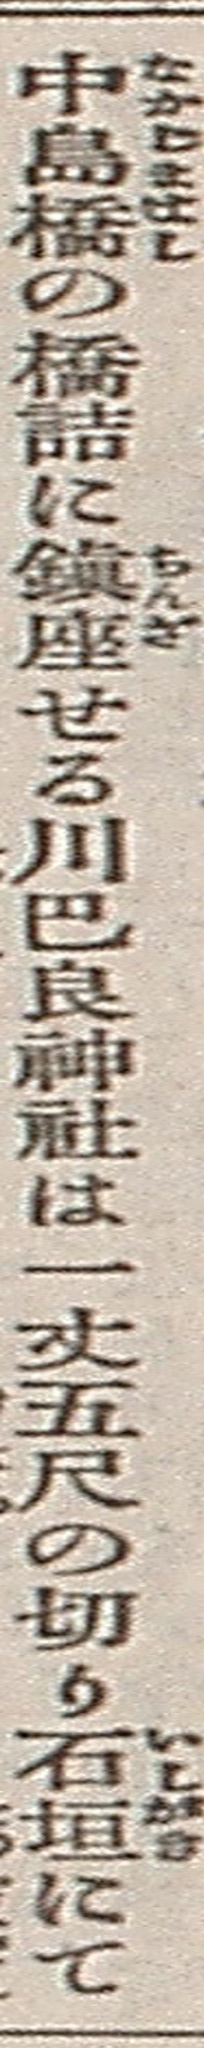中島橋の橋詰に鎮座せる川巴良神社は一丈五尺の切り石垣にて
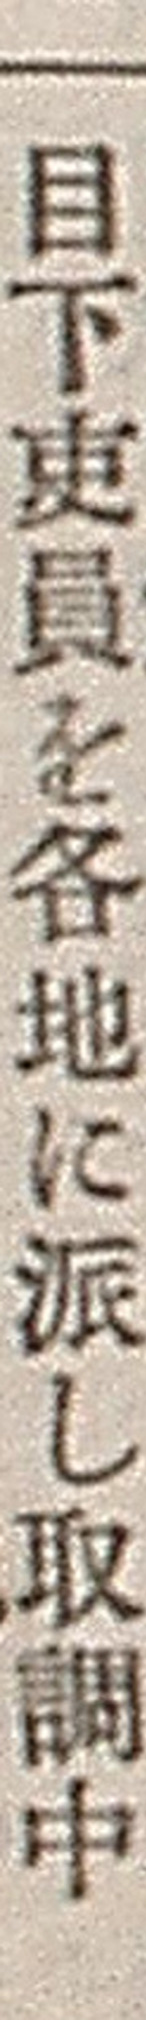目下吏員を各地に派し取調中
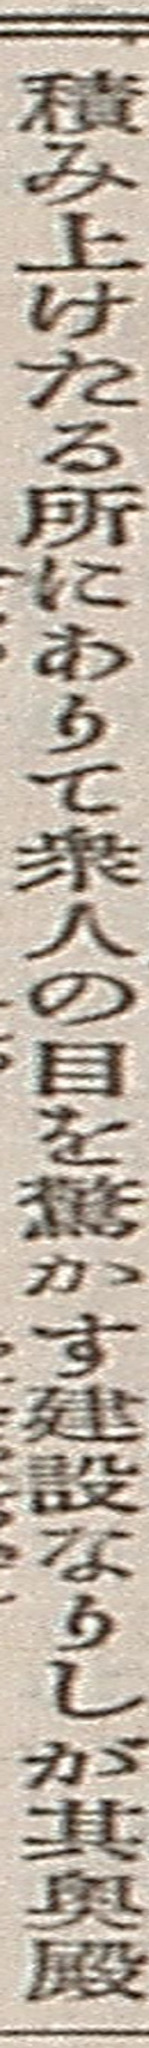積み上けたる所にありて衆人の目を驚かす建設なりしが其奥殿
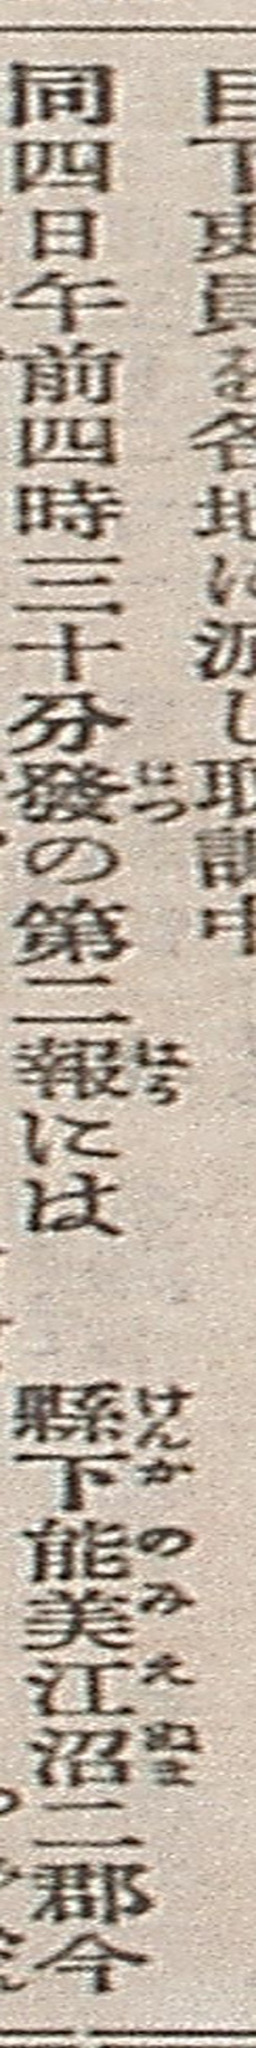同四日午前四時三十分発の第二報には県下能美江沼二郡今
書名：風俗畫報臨時増刊第百二十八號　洪水被害録（下）
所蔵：東京大学地震研究所図書室 Earthquake Research Institute Library, The University of Tokyo, JAPAN
